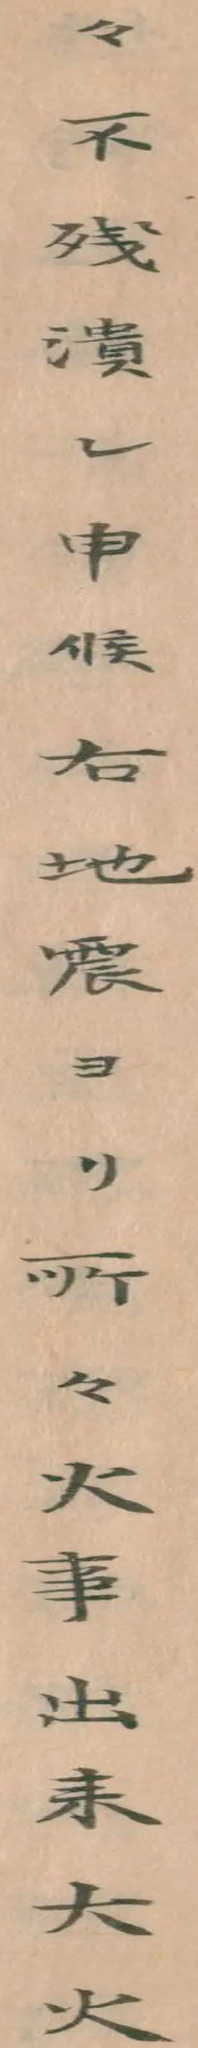堂不残潰レ申候右地震ヨリ所々火事出来大火
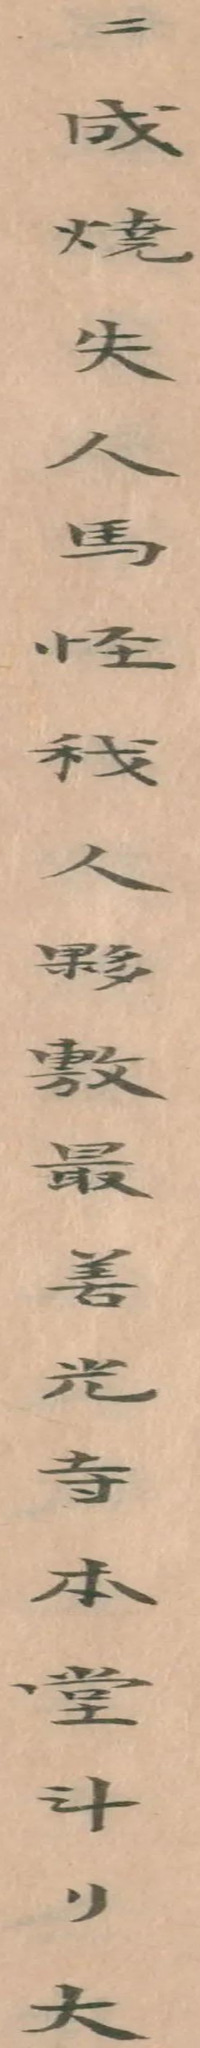二成焼失人馬怪我人夥敷最善光寺本堂斗り大
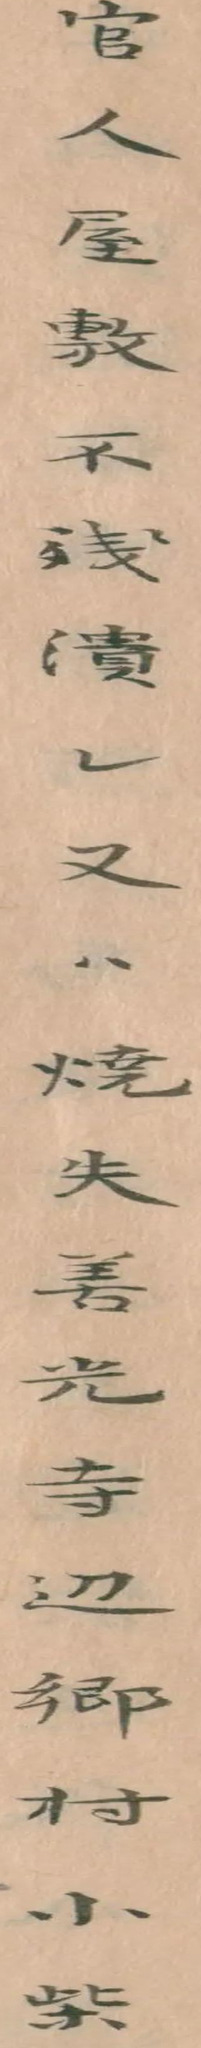官人屋敷不残潰シ又ハ焼失善光寺辺郷村小柴
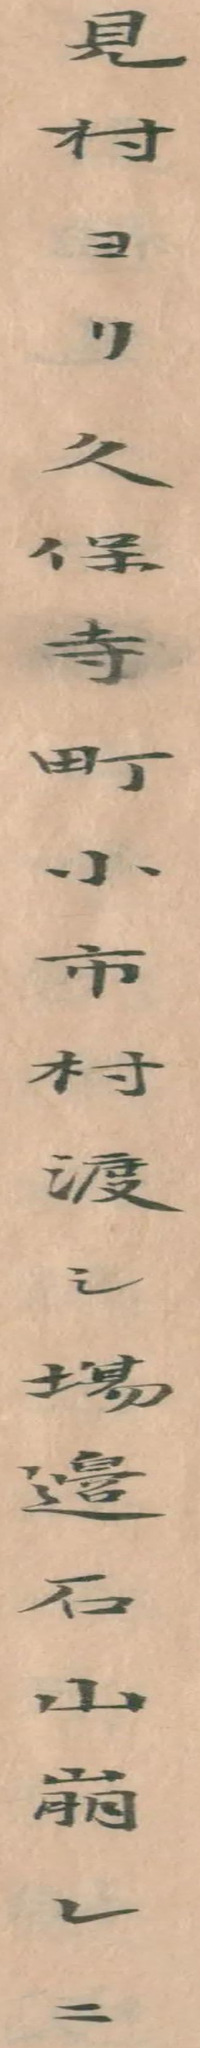見村ヨリ久保寺町小市村渡シ場辺石山崩レ二
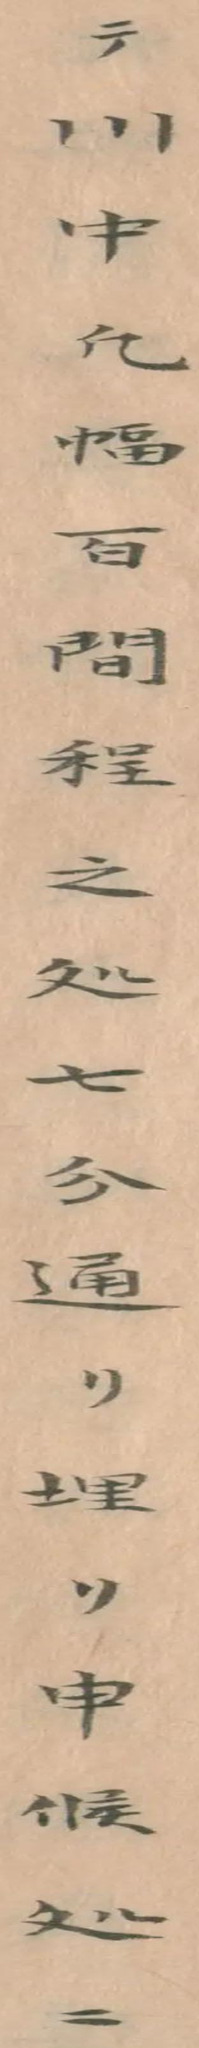テ川中凡幅百間程之処七分通り埋り申候処二

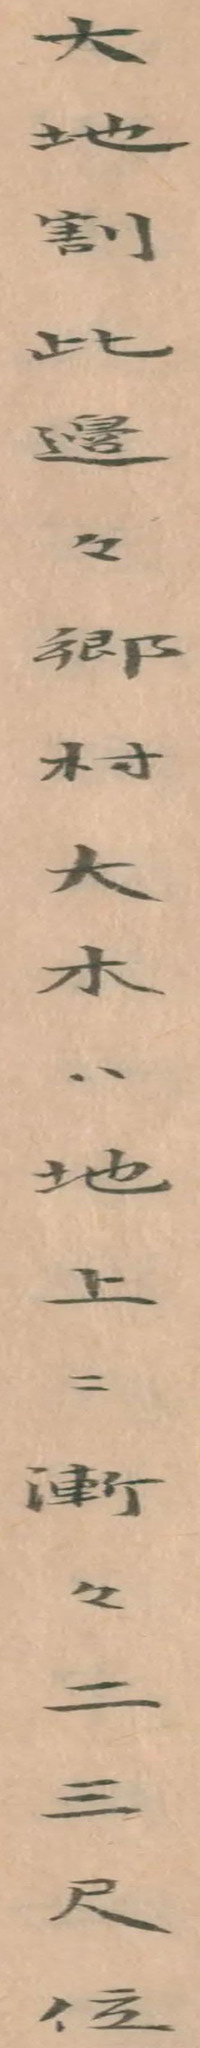大地割此辺々郷村大木ハ地上二漸々二三尺位
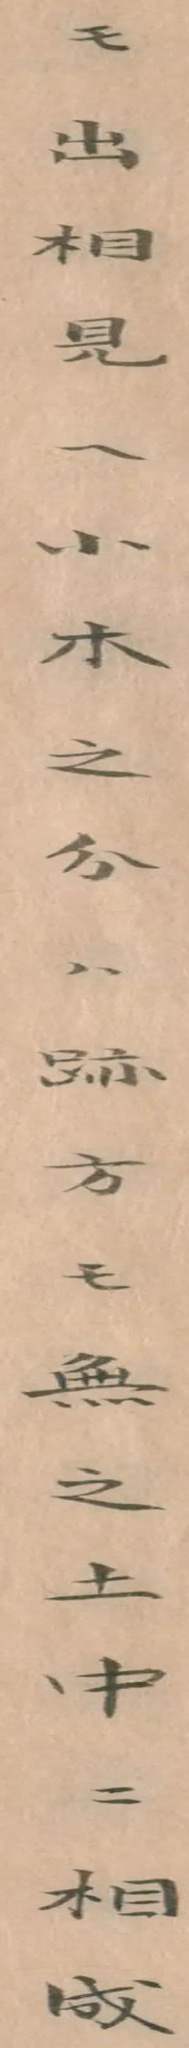モ出相見へ小木之分ハ跡方モ無之土中二相成
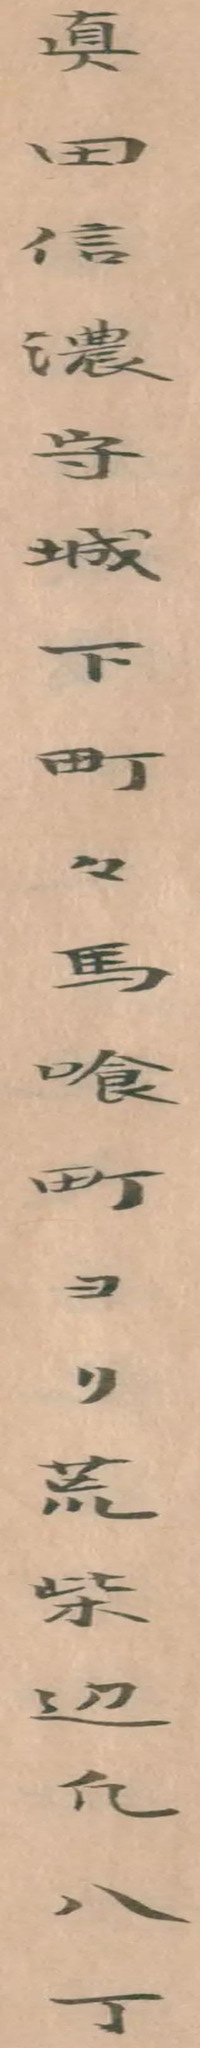真田信濃守城下町々馬喰町ヨリ荒芝辺凡八丁
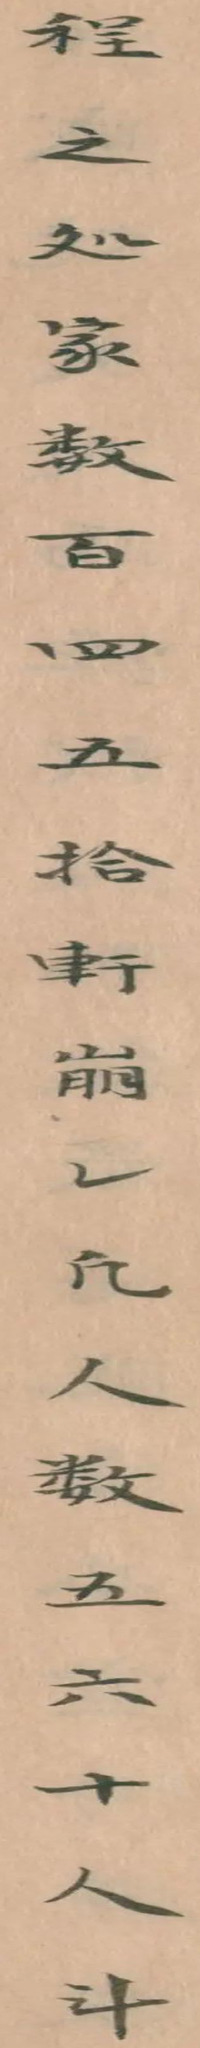程之処家数百四五拾軒崩レ凡人数五六十人斗
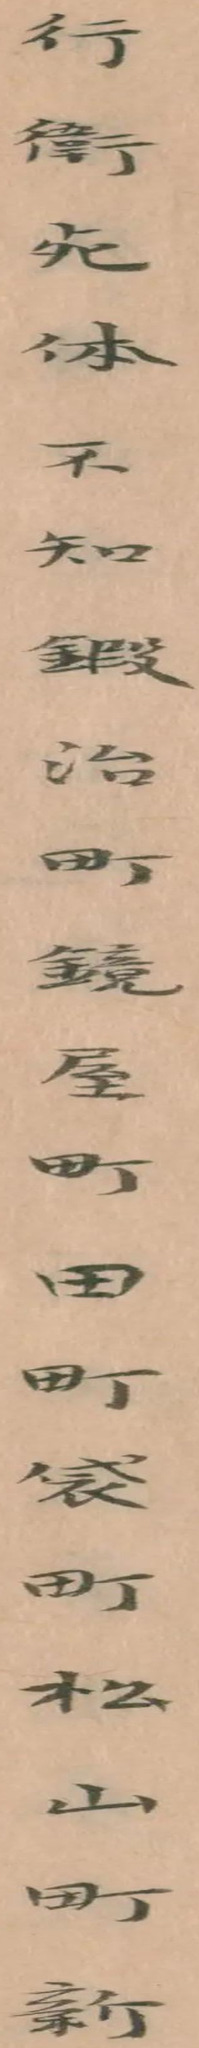行衛死体不知鍛冶町鏡屋町田町袋町松山町新
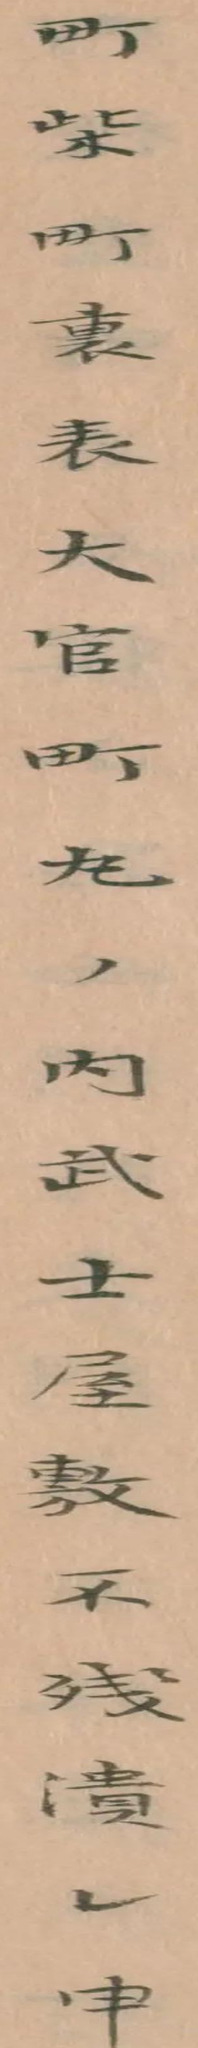町柴町裏表大官町丸ノ内武士屋敷不残潰レ申
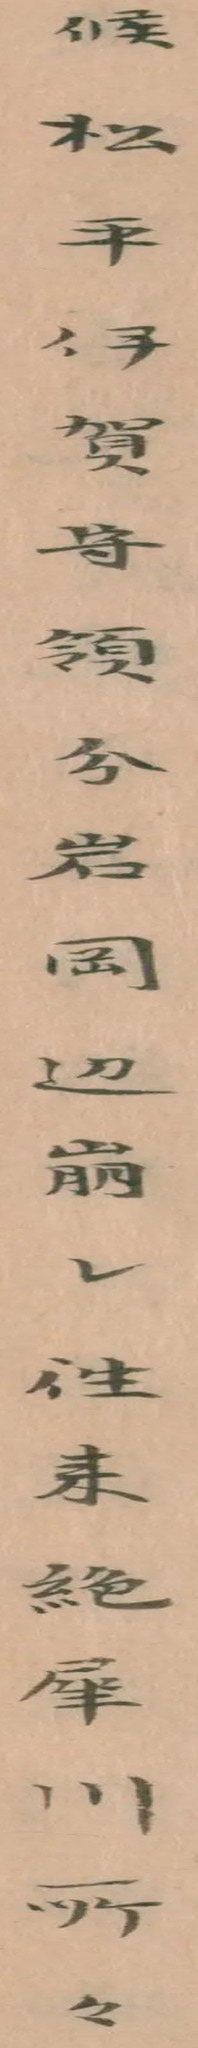候松平伊賀守領分岩岡辺崩レ往来絶犀川所々
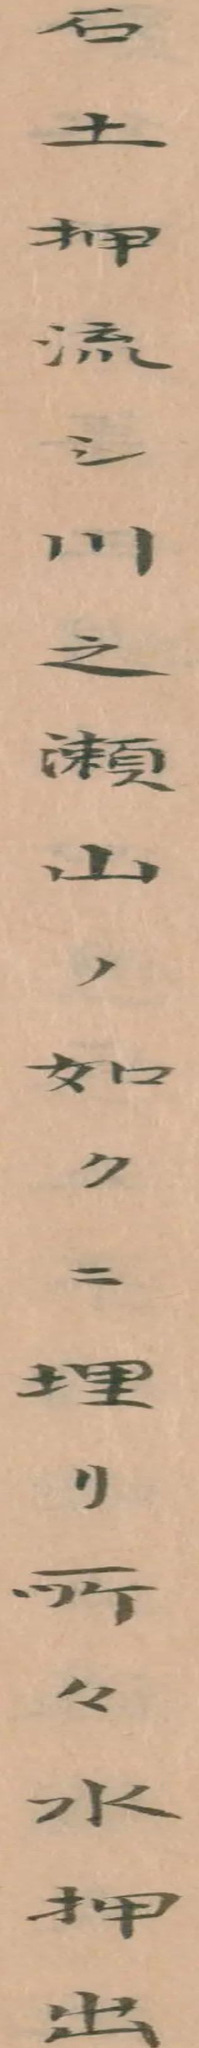石土押流シ川之瀬山ノ如クニ埋り所々水押出
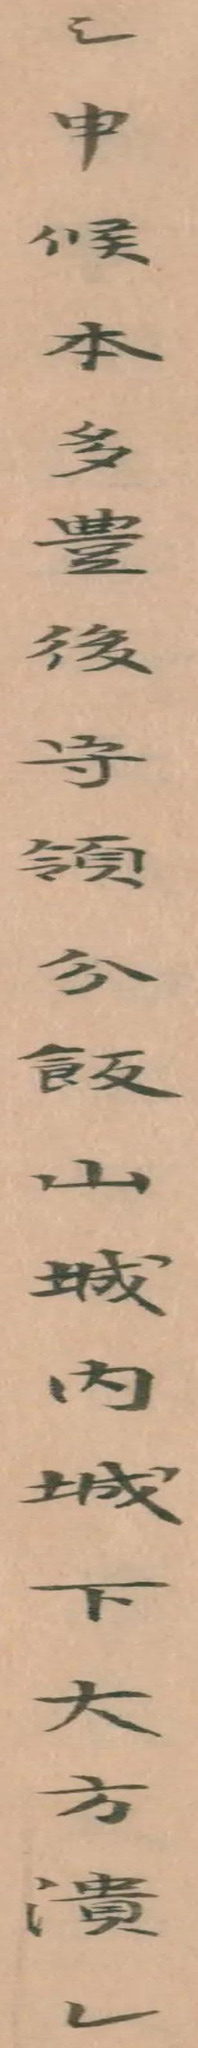シ申候本多豊後守領分飯山城内城下大方潰レ
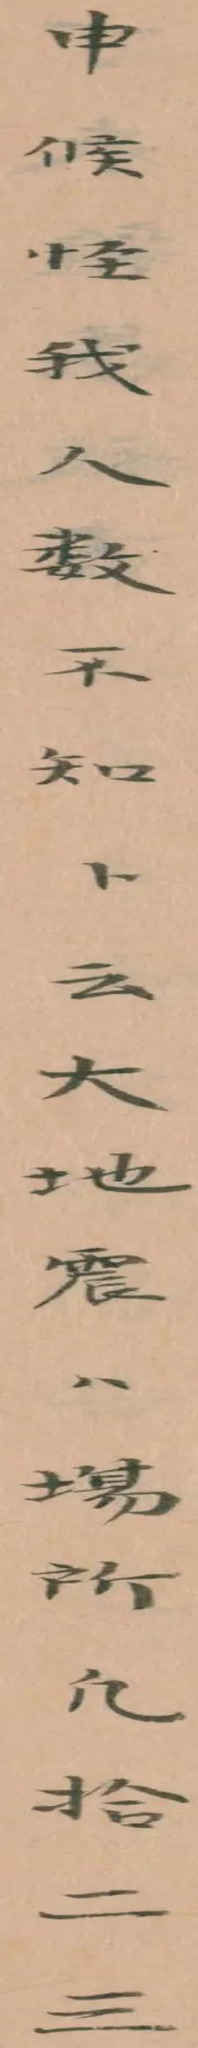申候怪我人数不知ト云大地震ハ場所凡拾二三
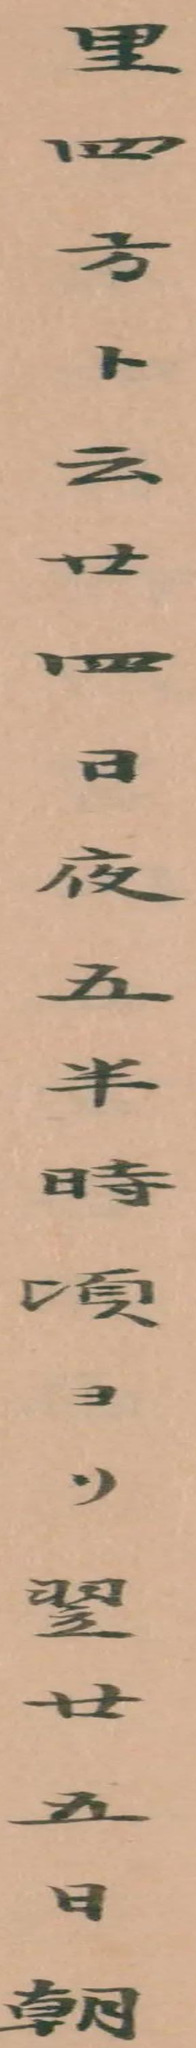里四方ト云廿四日夜五半時頃ヨリ翌廿五日朝
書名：地災撮要. 巻1(噴火山・地震ノ部)
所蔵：国立国会図書館 National Diet Library, JAPAN
